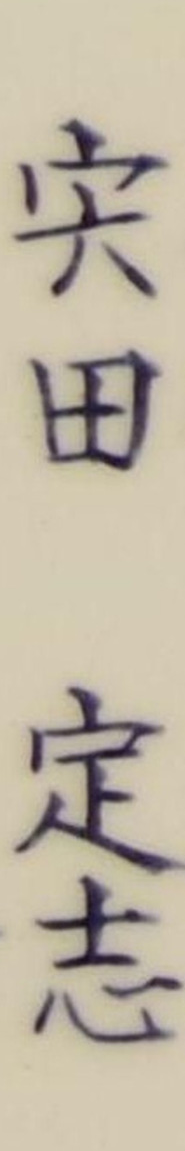宍田定志
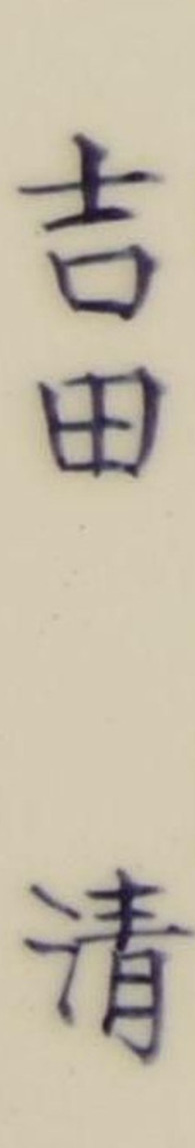吉田清

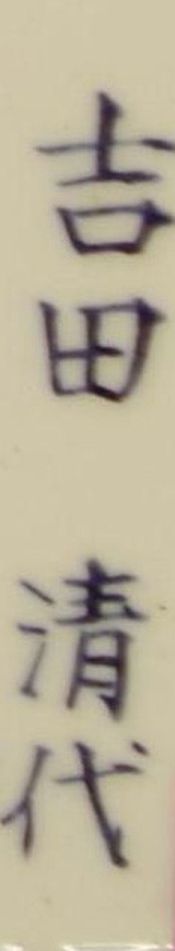吉田清代
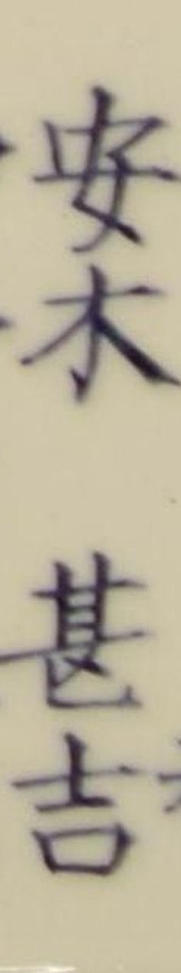安木甚吉
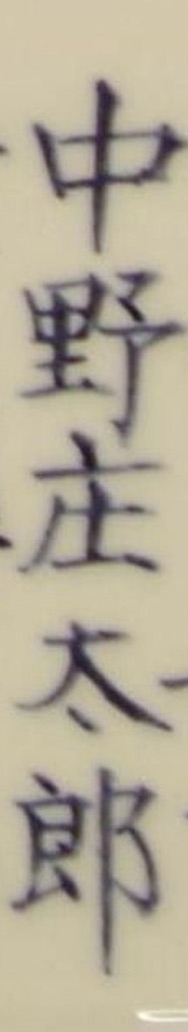中野庄太郎
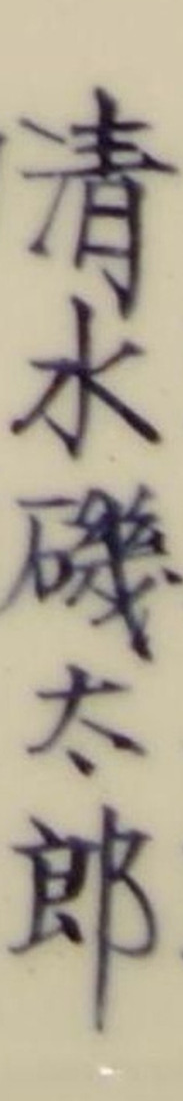清水磯太郎
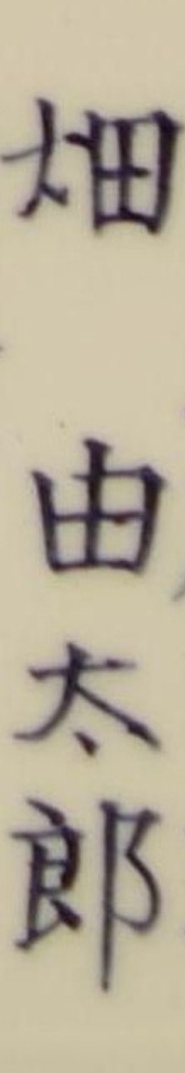畑由太郎
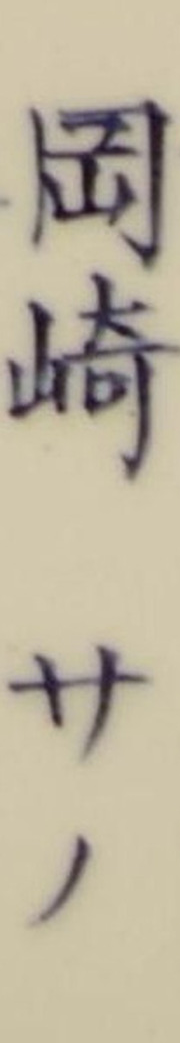岡崎サノ
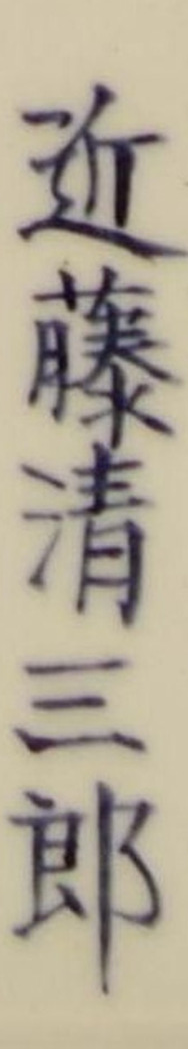近藤清三郎
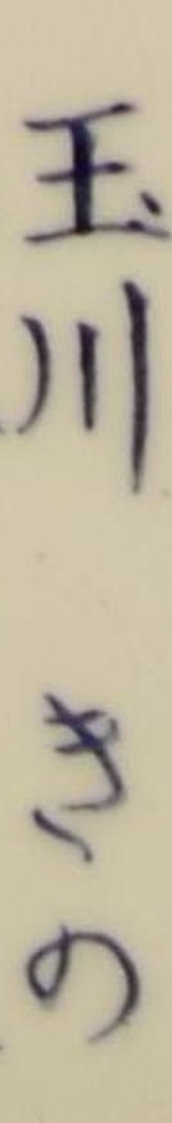玉川きの
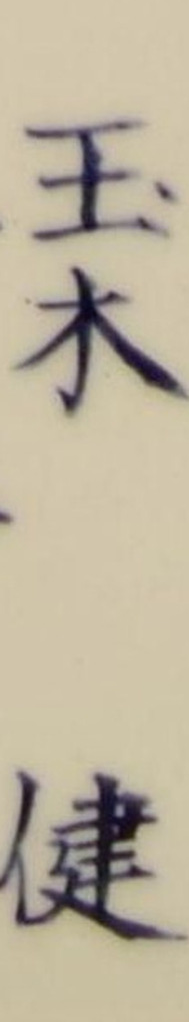玉木健
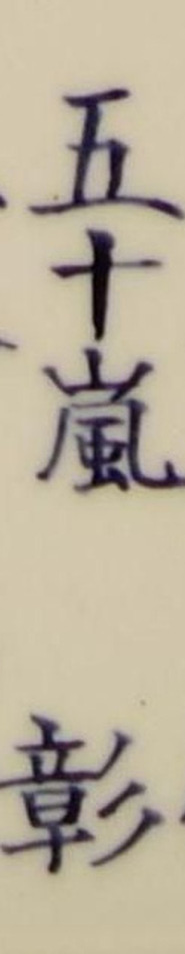五十嵐彰
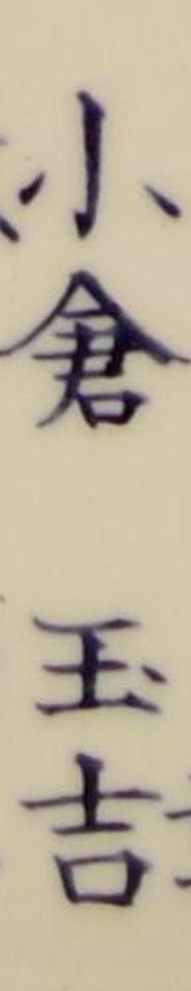小倉玉吉
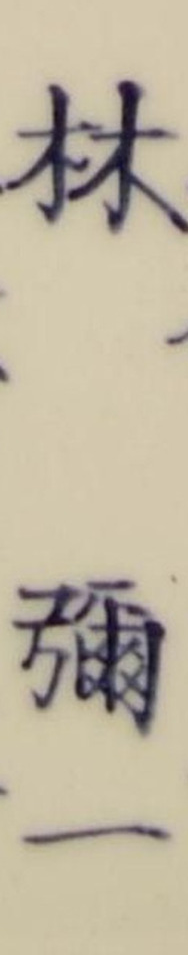林彌一
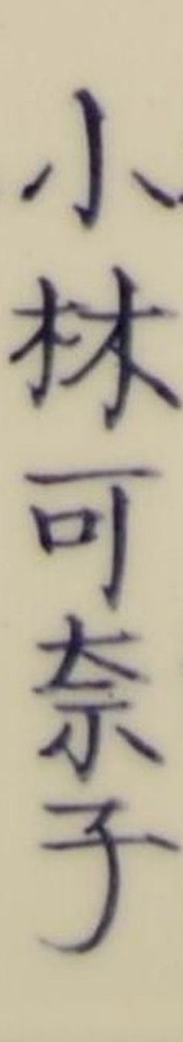小林可奈子
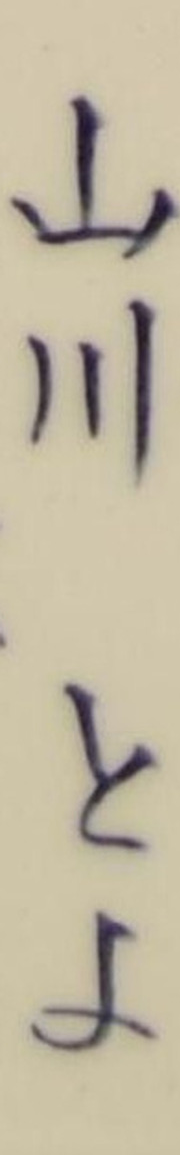山川とよ
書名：E~L
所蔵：高野山金剛峯寺
